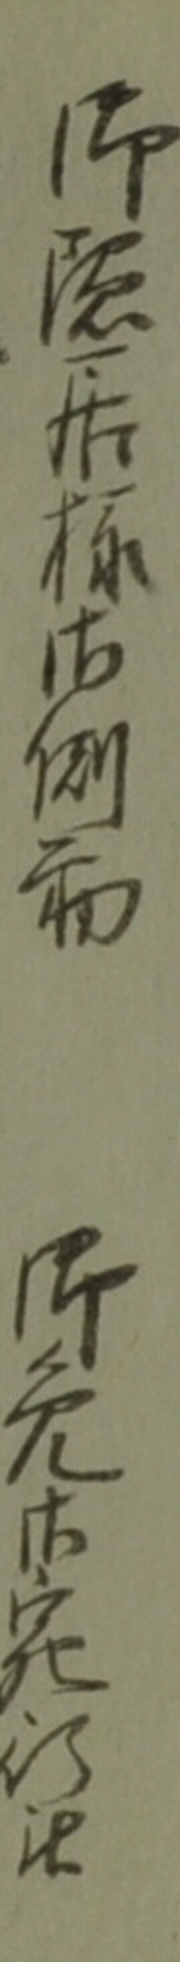御隠居様御側勤御免御宛行被
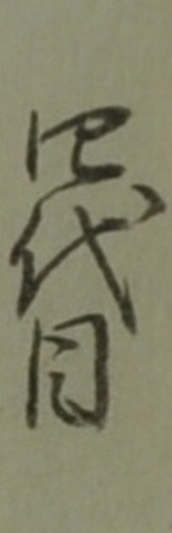四代目
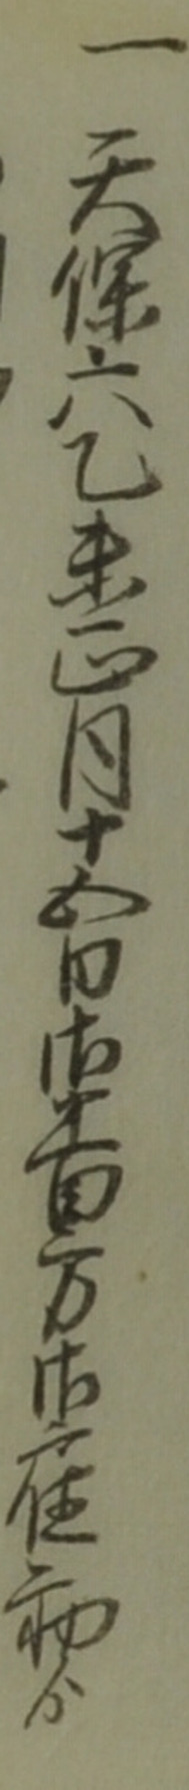一天保六乙未正月十五日御番方御雇勤ゟ
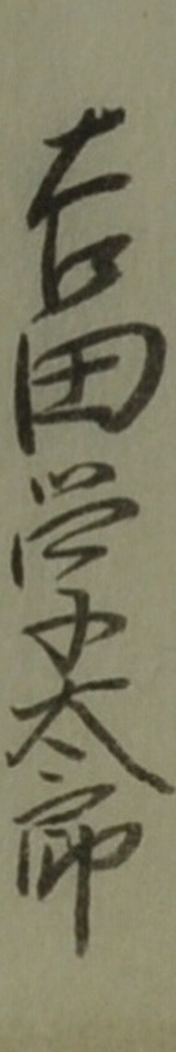吉田学太郎
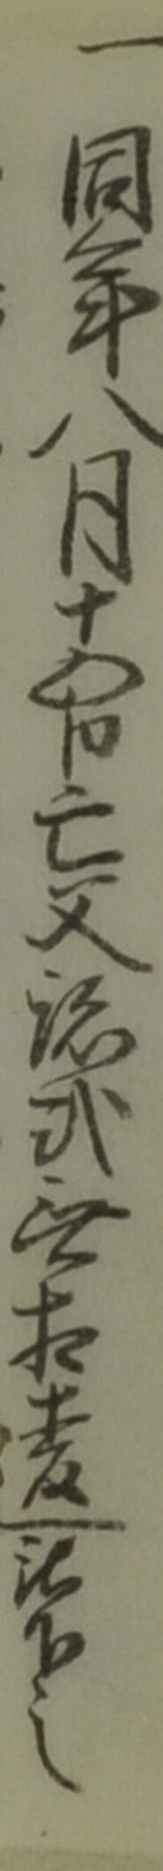一同年八月十五日亡父跡式無相違被下之
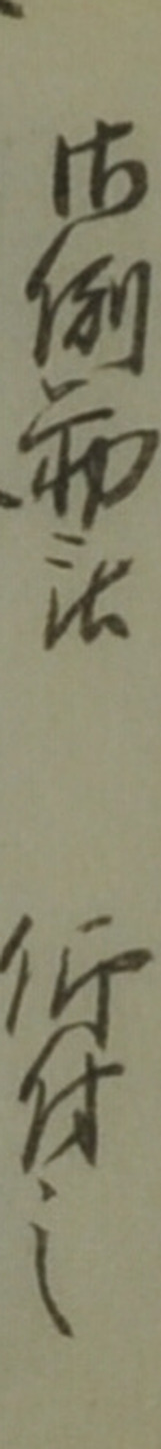御側勤被仰付之
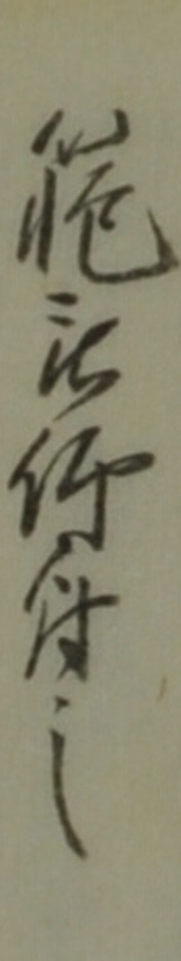範被仰付之
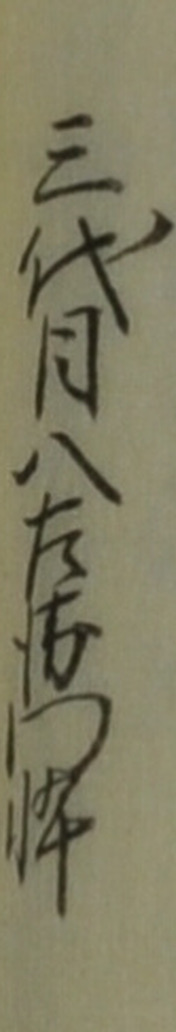三代目八左衛門忰
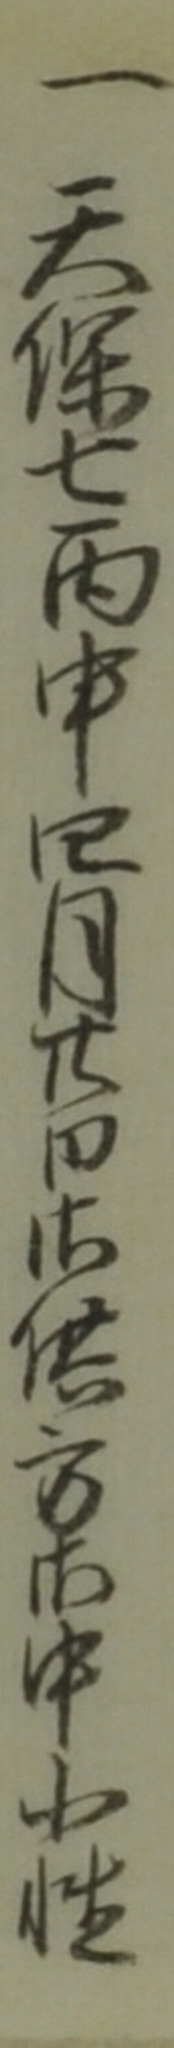一天保七丙申四月廿日御供方御中小性
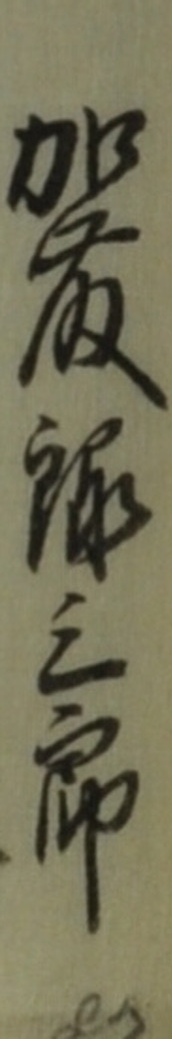加藤録三郎
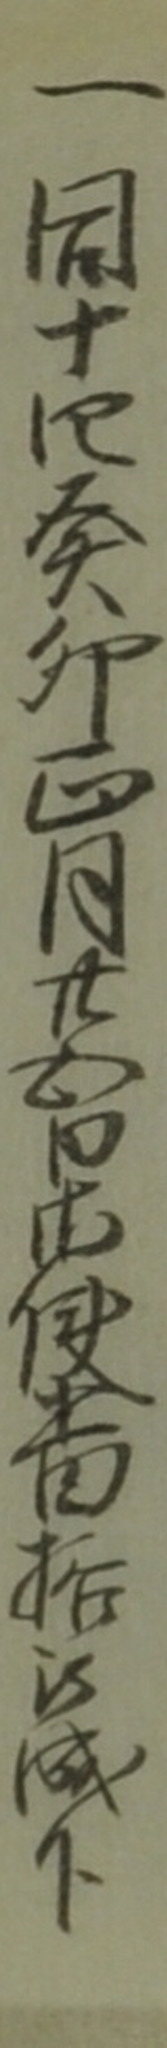一同十四癸卯正月廿五日御使番格被成下
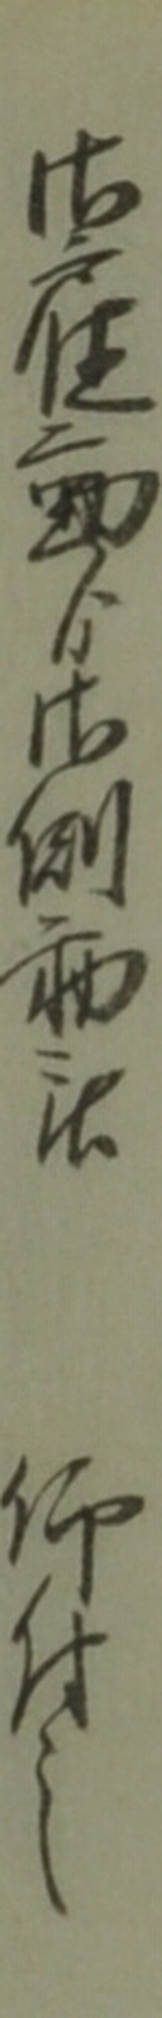御雇勤ゟ御側勤被仰付之
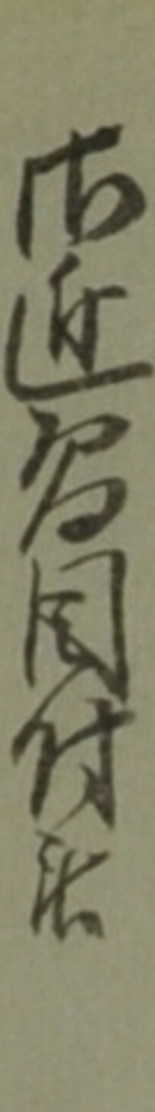御近習目付無滞
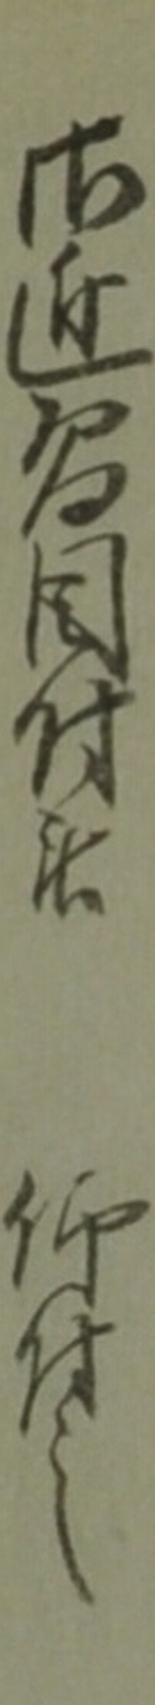御近習目付被仰付之
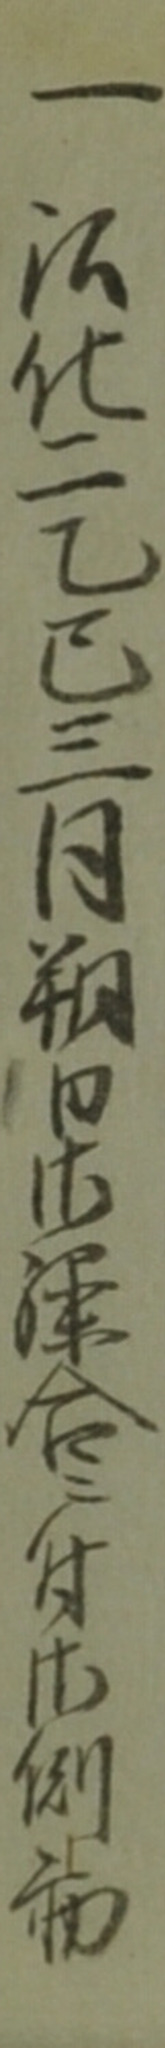一弘化二乙巳三月朔日御繰合ニ付御側勤
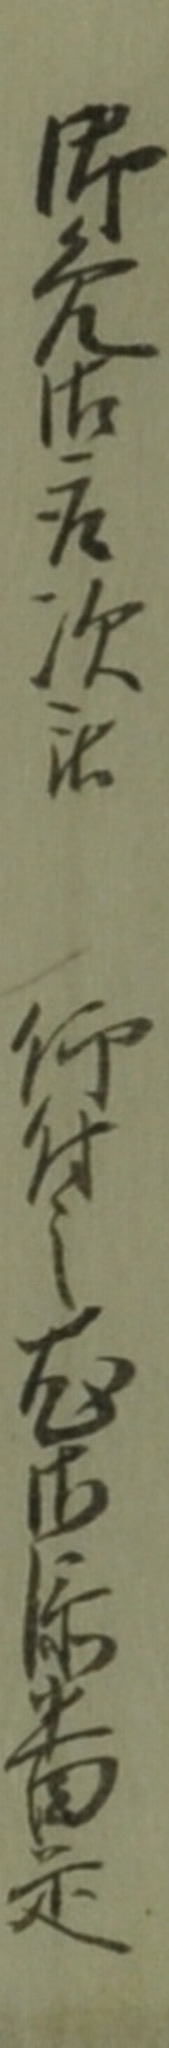御免御取次被仰付之尤御添番是
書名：諸御役代々録（五）
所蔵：伊那市立高遠町図書館・合同会社AMANE
